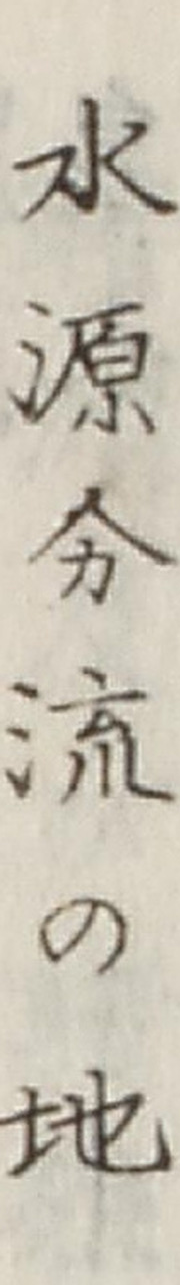水源分流の地
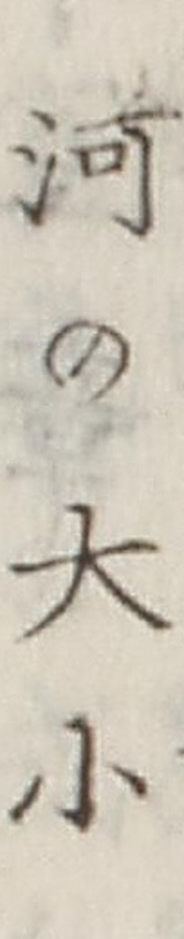河の大小
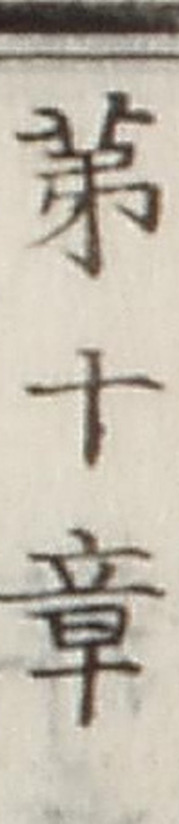第十章
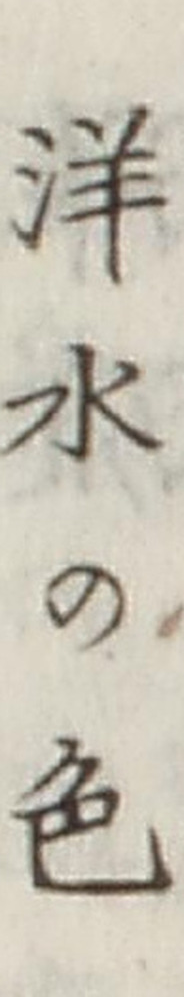洋水の色
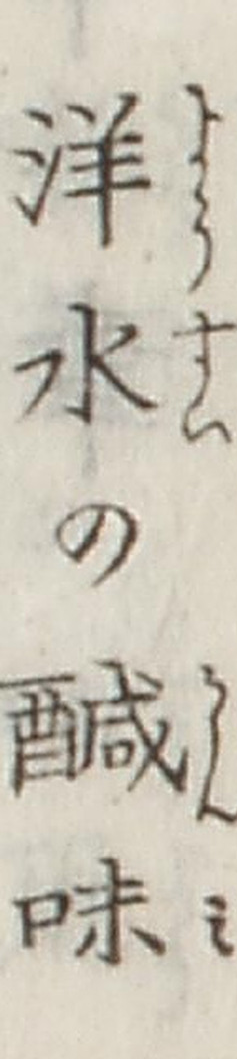洋水の鹹味
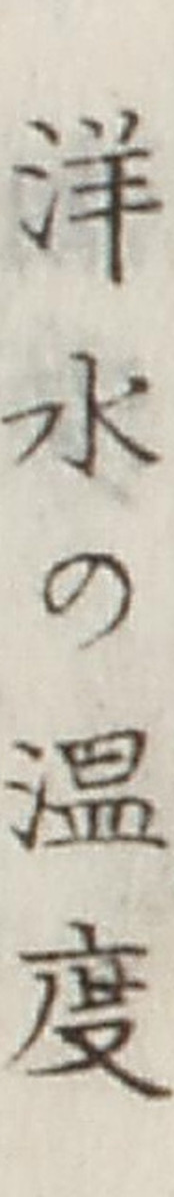洋水の温度
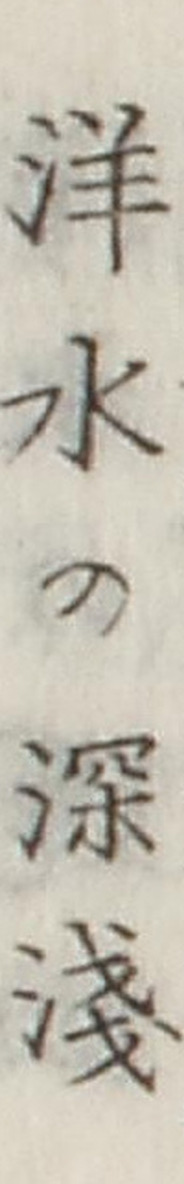洋水の深浅
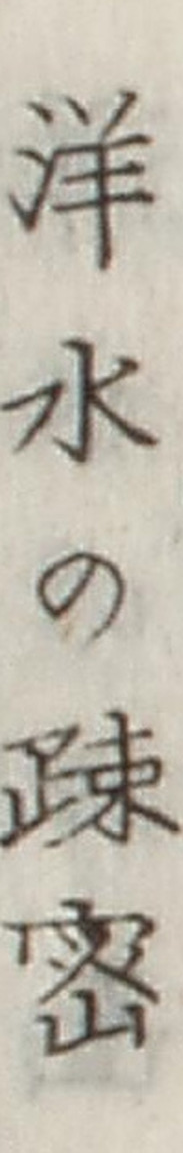洋水の疎密

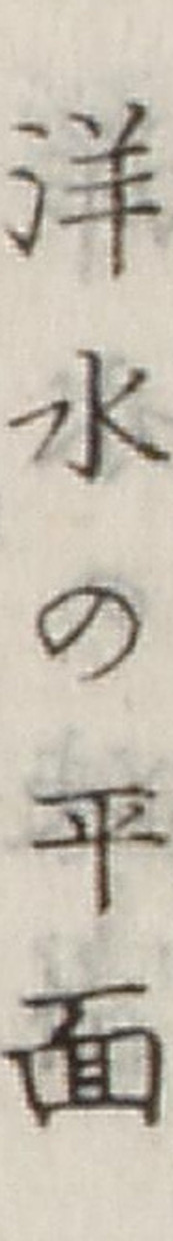洋水の平面
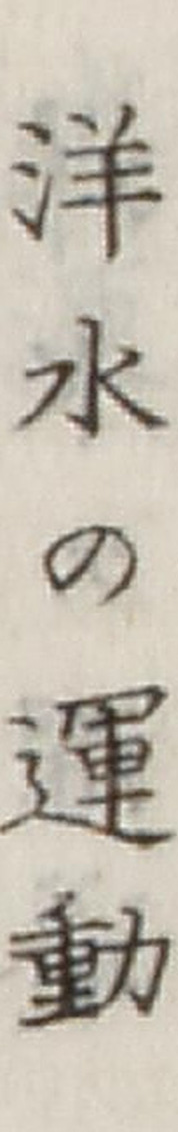洋水の運動
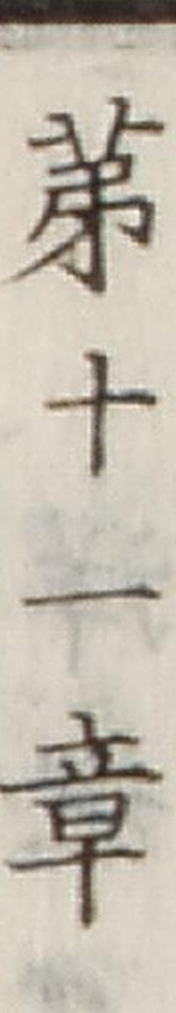第十一章
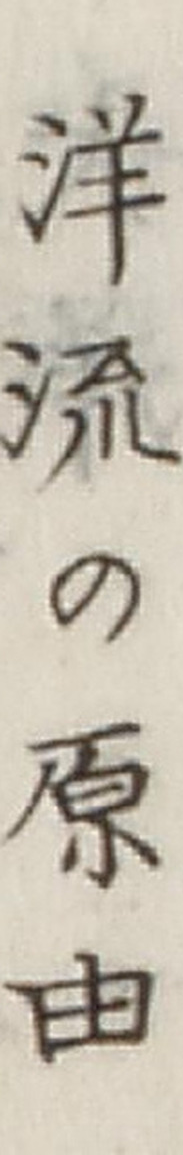洋流の原由
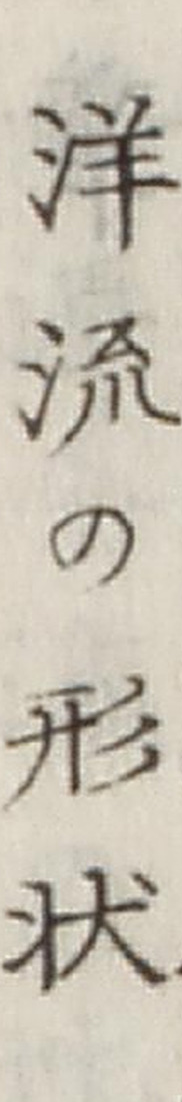洋流の形状
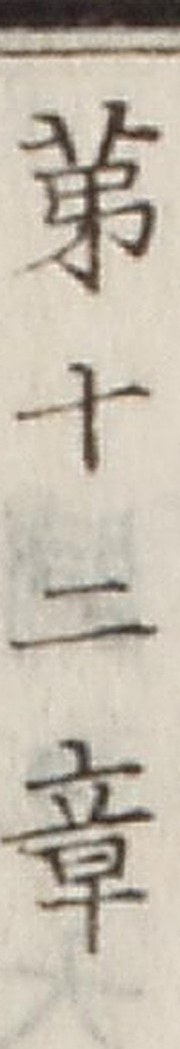第十二章
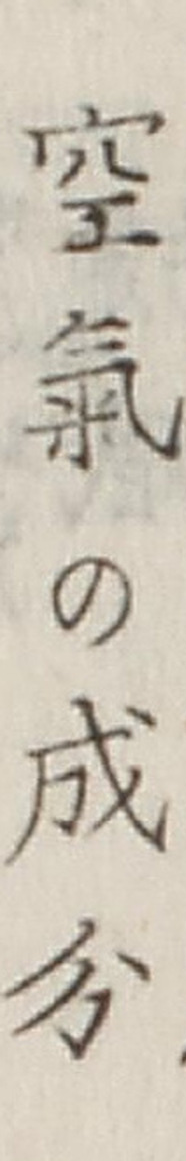空気の成分
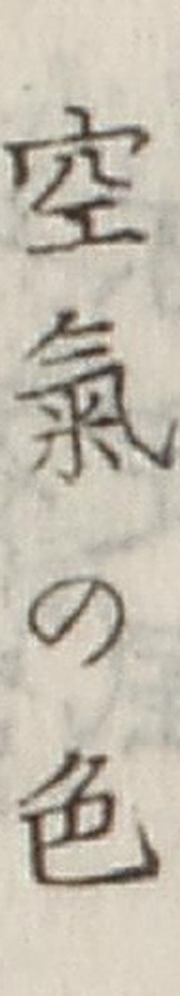空気の色
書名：訓蒙　天然地理學　上
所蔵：東京大学地震研究所図書室 Earthquake Research Institute Library, The University of Tokyo, JAPAN
